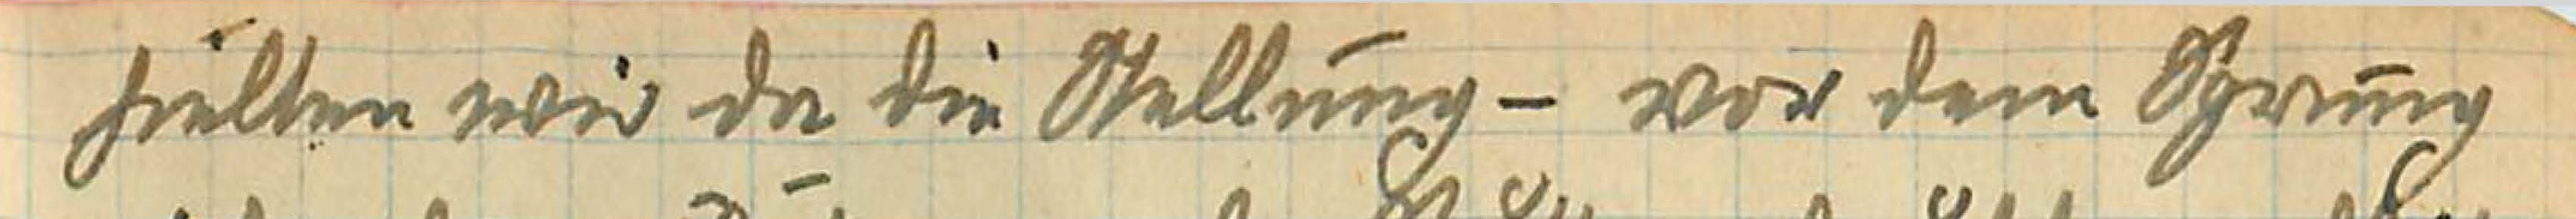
hielten wir da die Stellung – vor dem Sprung
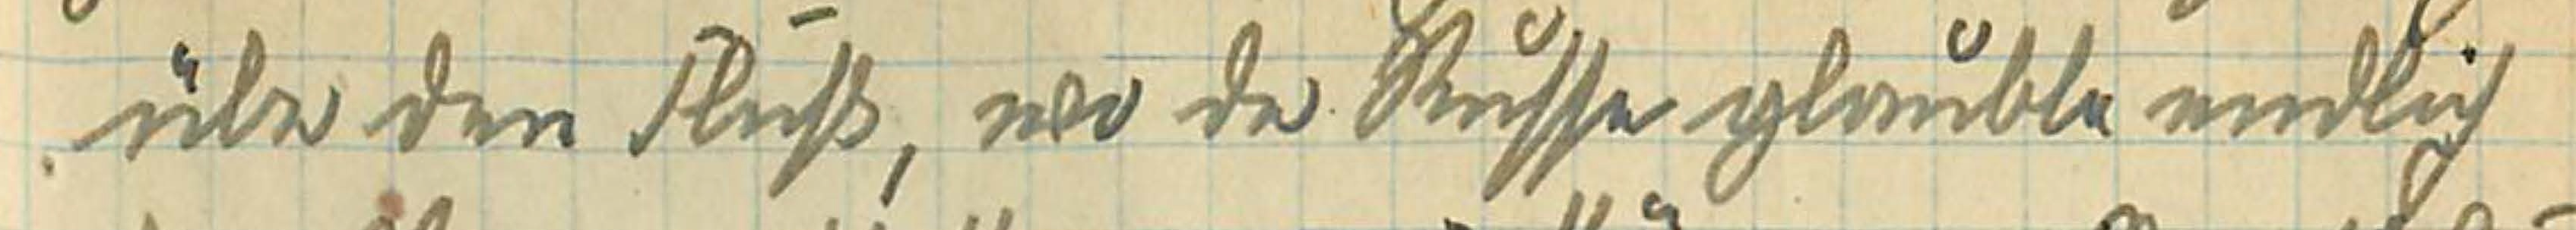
über den Fluß, wo der Russe glaubte endlich
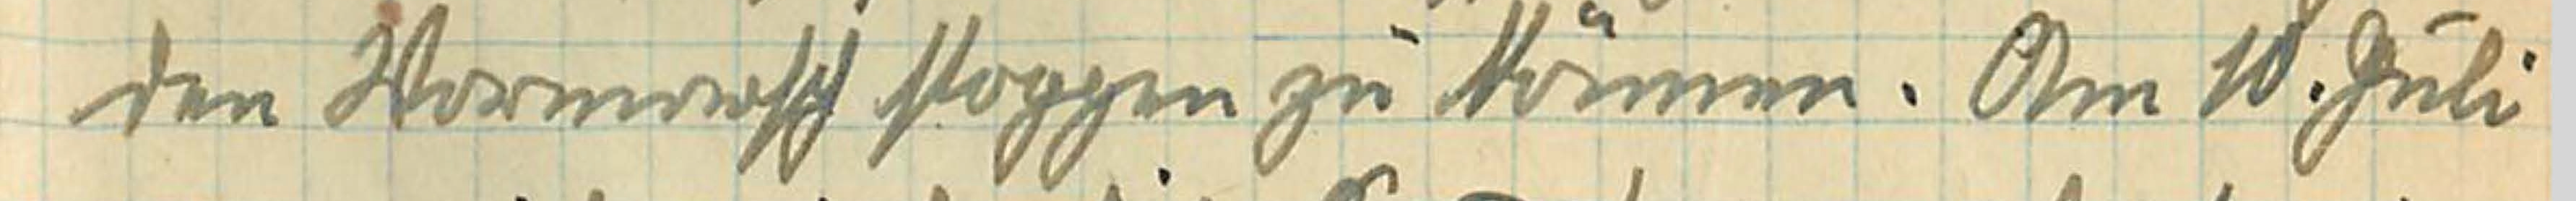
den Vormarsch stoppen zu können. Am 10. Juli
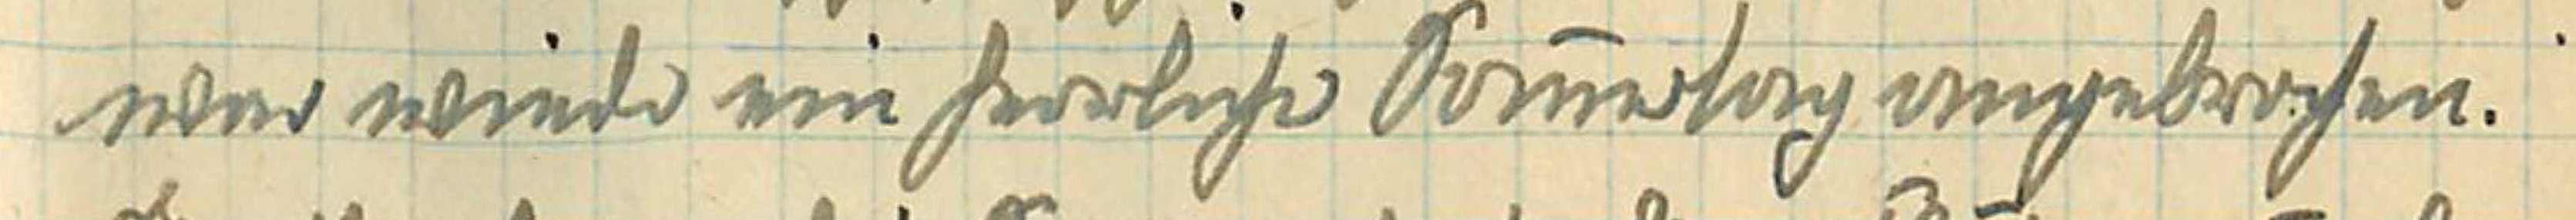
war wieder ein herrlicher Sommertag angebrochen.
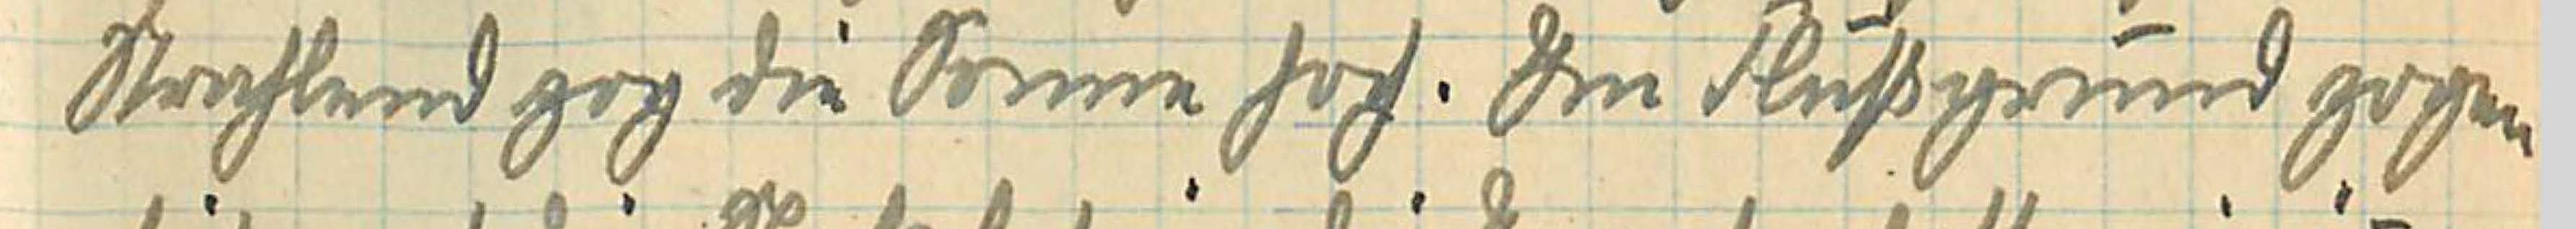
Strahlend zog die Sonne hoch. Im Flußgrund zogen
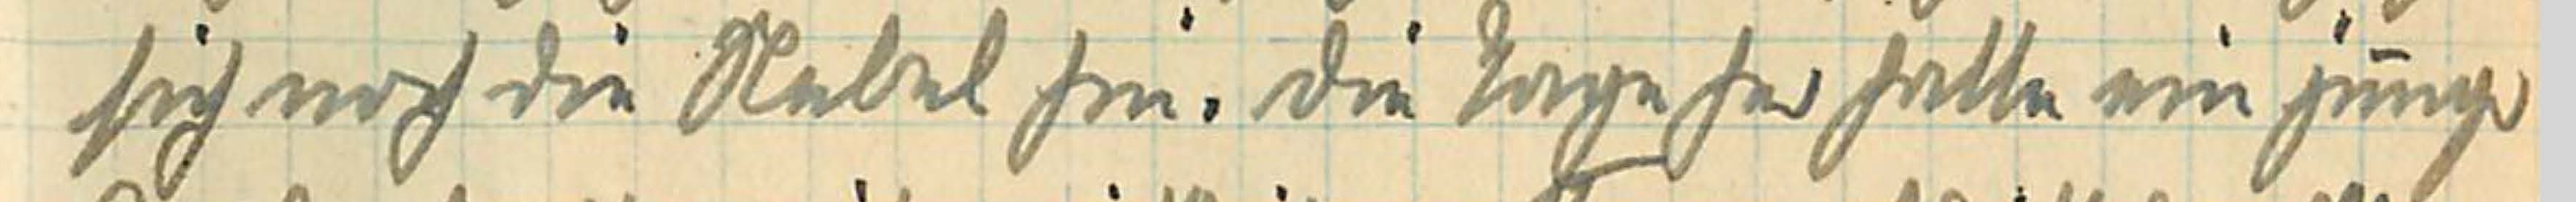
sich noch die Nebel hin. Die Tage her hatte ein junger
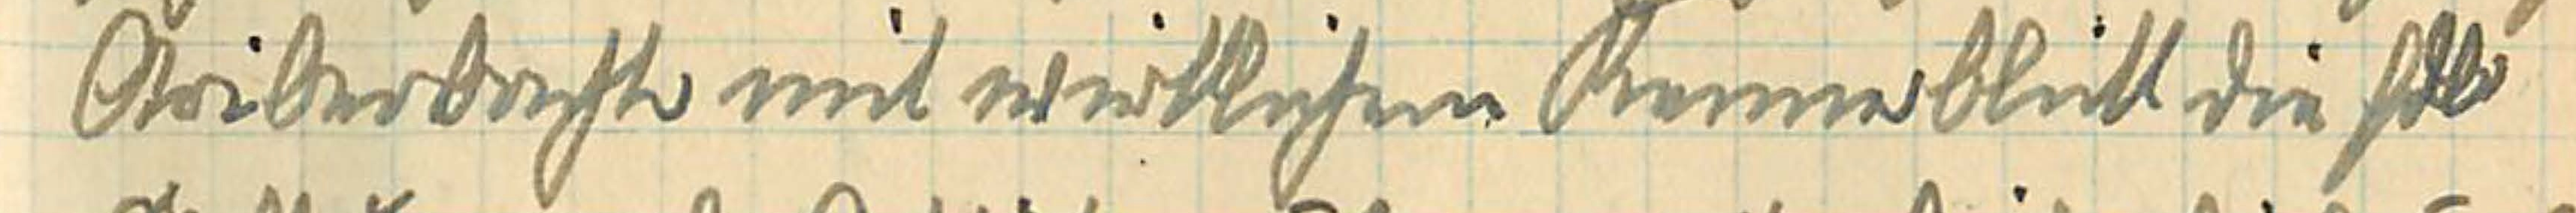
Aribeobachter mit wirklichem Kennerblick die fdl.
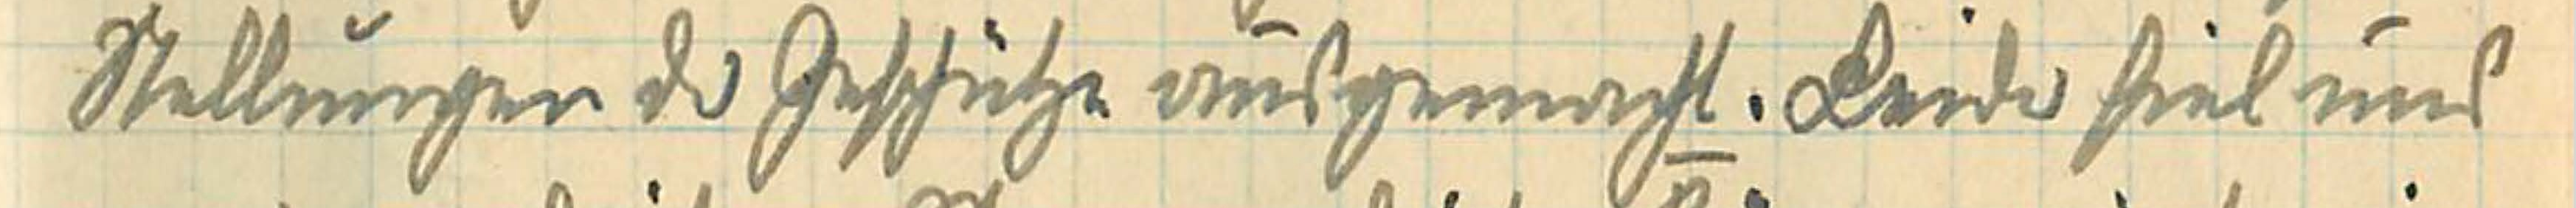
Stellungen der Geschütze ausgemacht. Leider fiel uns
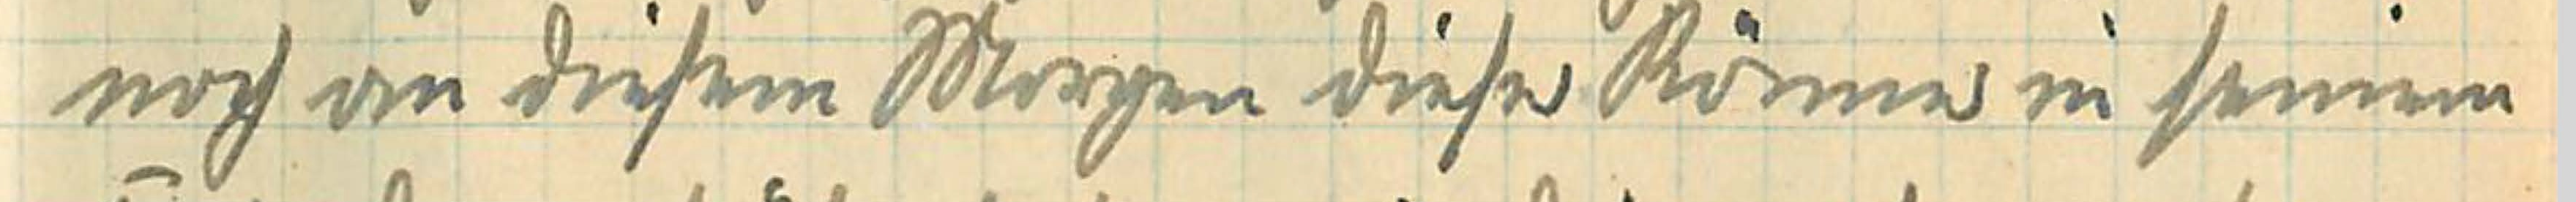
noch an diesem Morgen dieser Könner in seinem
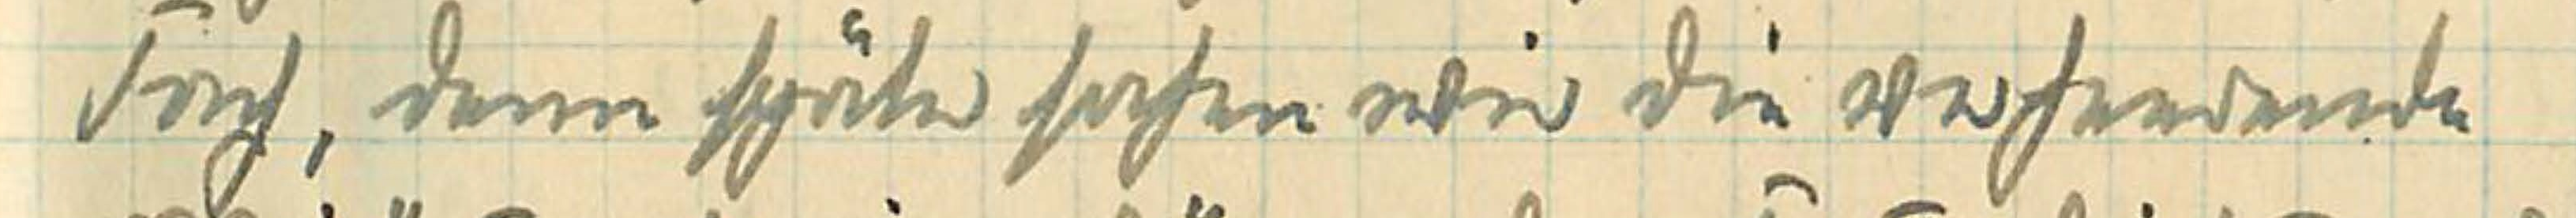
Fach, denn später sahen wir die verheerende
